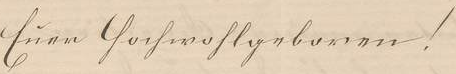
Euer Hochwohlgeboren!
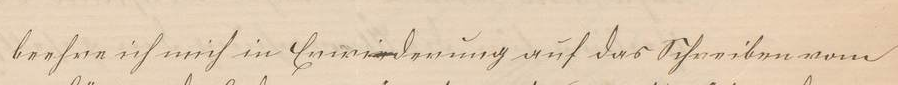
Beehre ich mich in Erwiderung auf das Schreiben vom
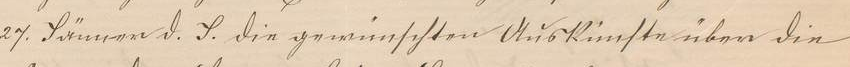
27. Jänner d. J. die gewünschten Auskünfte über die
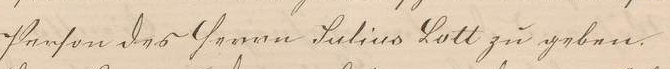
Person des Herrn Julius Lott zu geben.
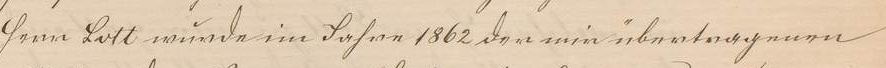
Herr Lott wurde im Jahre 1862 der mir übertragenen
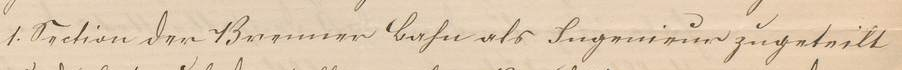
1. Section der Brenner Bahn als Ingenieur zugeteilt
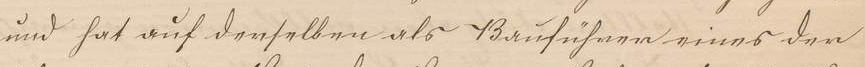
und hat auf derselben als Bauführer eines der
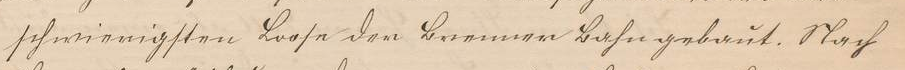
schwierigsten Loose der Brenner Bahn gebaut. Nach
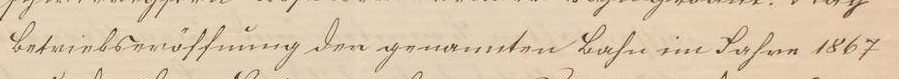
Betriebseröffnung der genannten Bahn im Jahre 1867
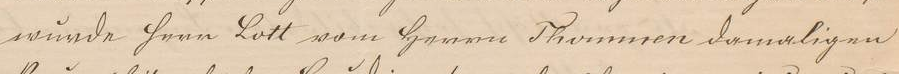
wurde Herr Lott vom Herrn Thommen damaligen
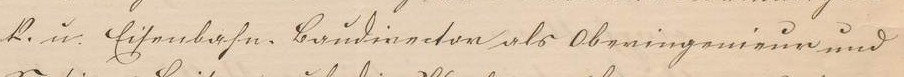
k. u. Eisenbahn-Baudirector als Oberingenieur und
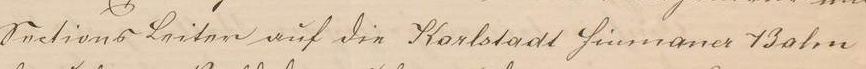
Sections Leiter auf die KarlstadtFiumaner Bahn
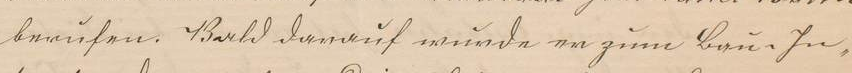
berufen. Bald darauf wurde er zum Bau-In-
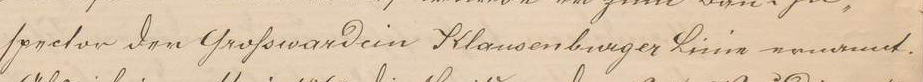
spector der GrosswardeinKlausenburger Linie ernannt.
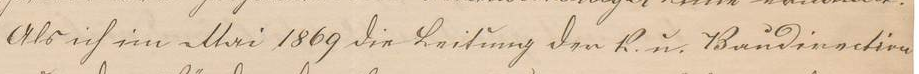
Als ich im Mai 1869 die Leitung der k. u. Baudirection
